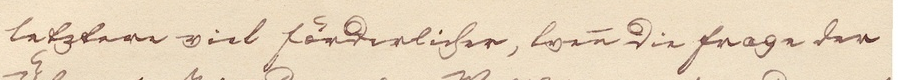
letztere viel förderlicher, wenn die Frage der
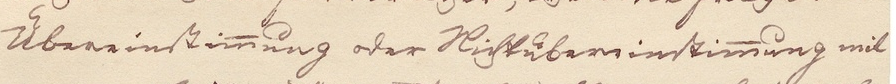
Übereinstimmung oder Nichtübereinstimmung mit
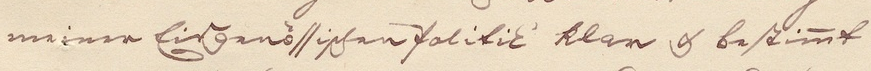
meiner Eidgenössischen Politik klar & bestimmt
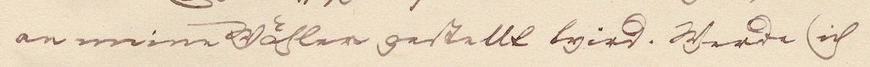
an meine Wähler gestellt wird. Werde ich
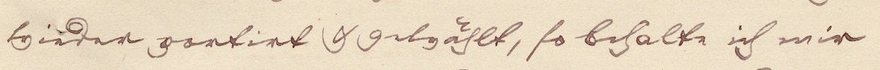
wieder portirt & gewählt, so behalte ich mir
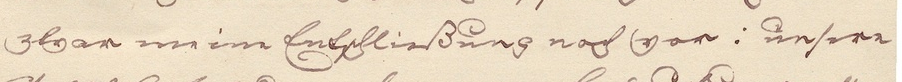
zwar meine Entschließung noch vor: unsere
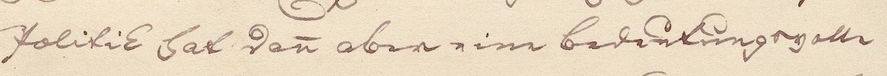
Politik hat dann aber eine bedeutungsvolle
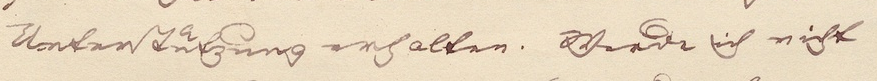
Unterstützung erhalten. Werde ich nicht
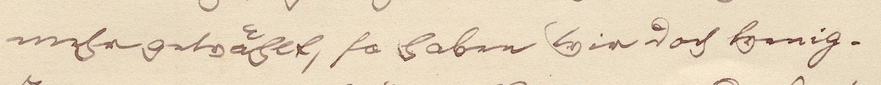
mehr gewählt, so haben wir doch wenig-
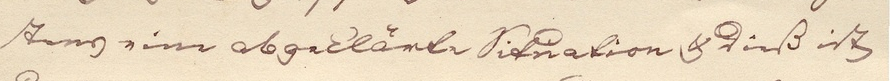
stens eine abgeklärte Situation & dieß ist
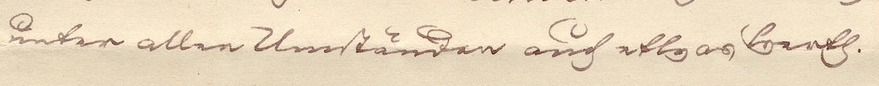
unter allen Umständen auch etwas werth.
